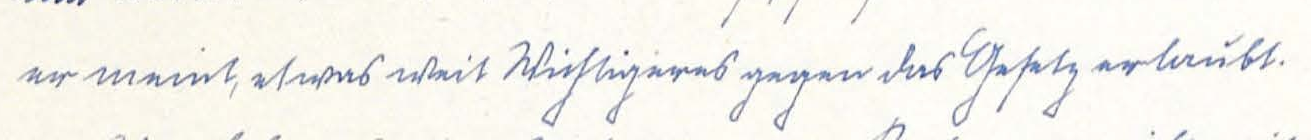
er meint, etwas weit Wichtigeres gegen das Gesetz erlaubt.
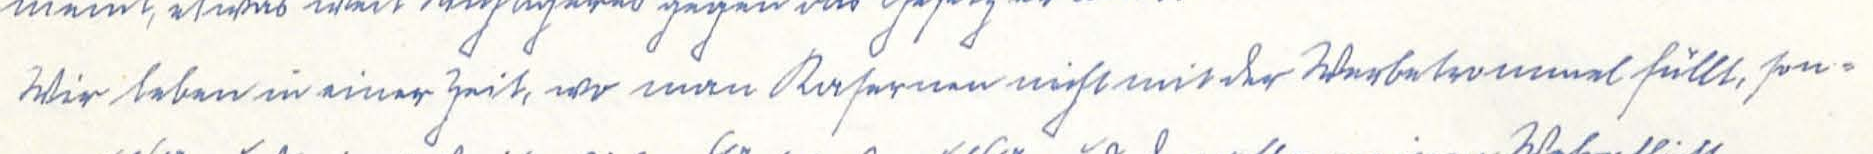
Wir leben in einer Zeit, wo man Kasernen nicht mit der Werbetrommel füllt, son-
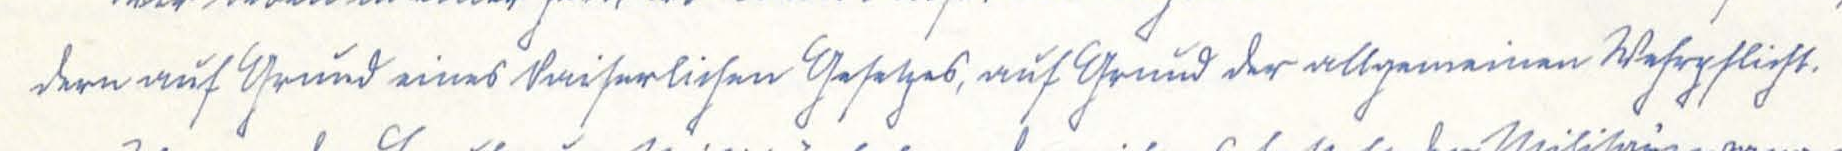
dern auf Grund eines kaiserlichen Gesetzes, auf Grund der allgemeinen Wehrpflicht.
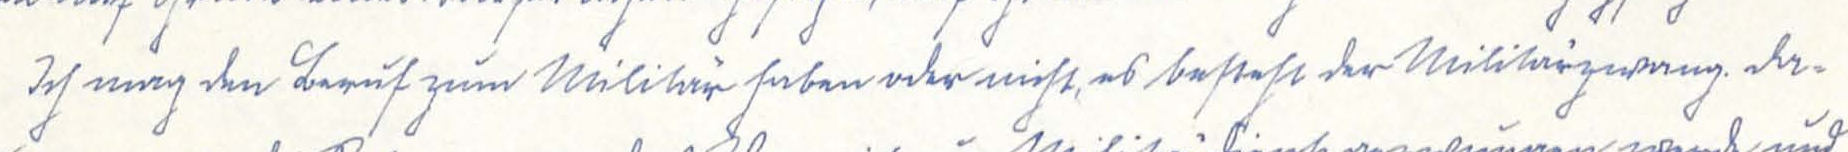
Ich mag den Beruf zum Militär haben oder nicht, es besteht der Militärzwang. Da-
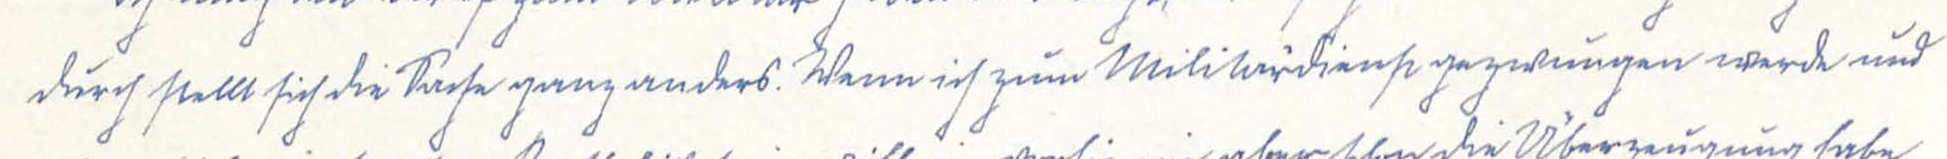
durch stellt sich die Sache ganz anders. Wenn ich zum Militärdienst gezwungen werde und
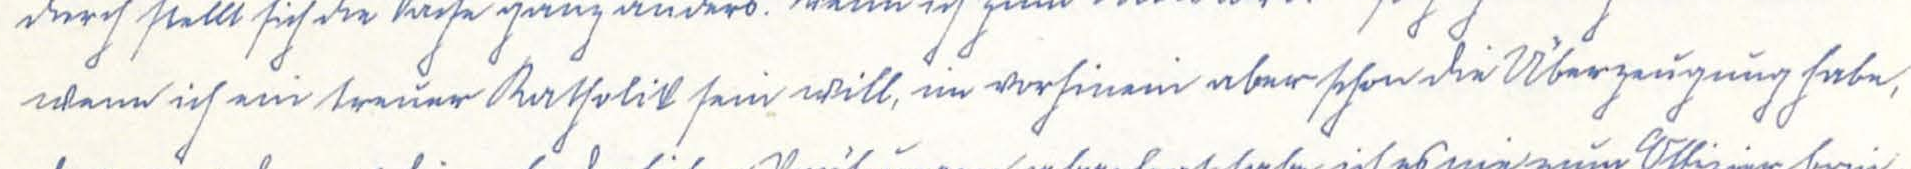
wenn ich ein treuer Katholik sein will, im vorhinein aber schon die Überzeugung habe,
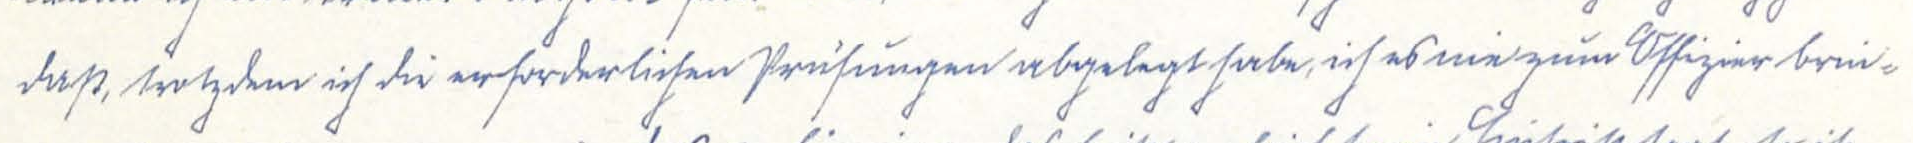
daß, trotzdem ich die erforderlichen Prüfungen abgelegt habe, ich es nie zum Ofizier brin
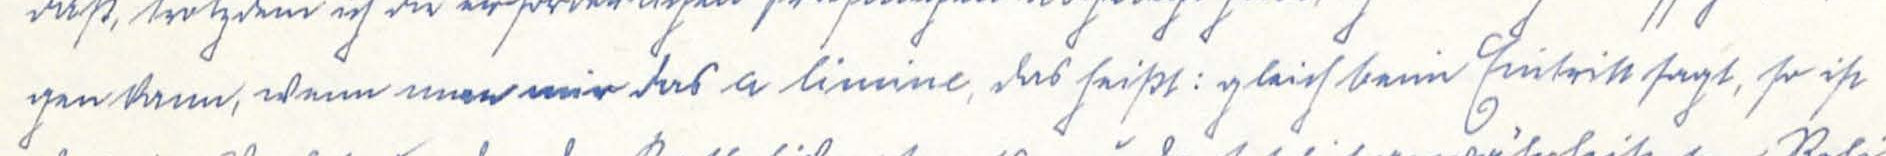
gen kann, wenn man mir das a limine, das heißt: gleich beim Eintritt sagt, so ist
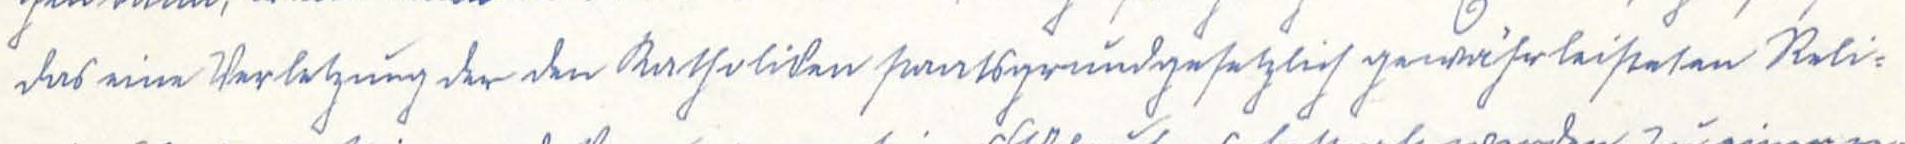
das eine Verletzung der den Katholiken staatsgrundgesetzlich gewährleisteten Reli-
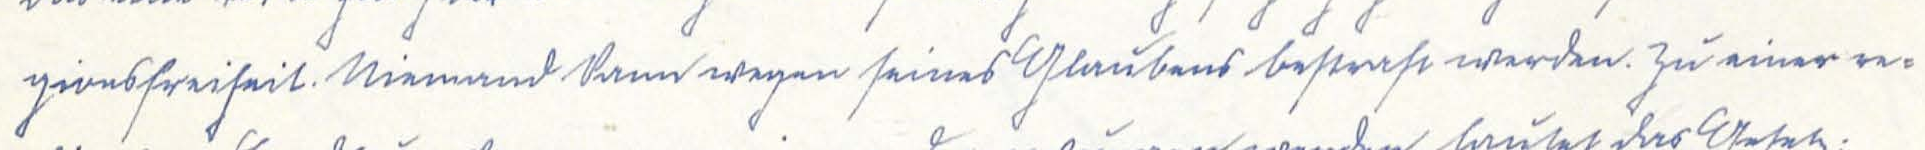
gionsfreiheit. Niemand kann wegen seines Glaubens bestraft werden. Zu einer re-
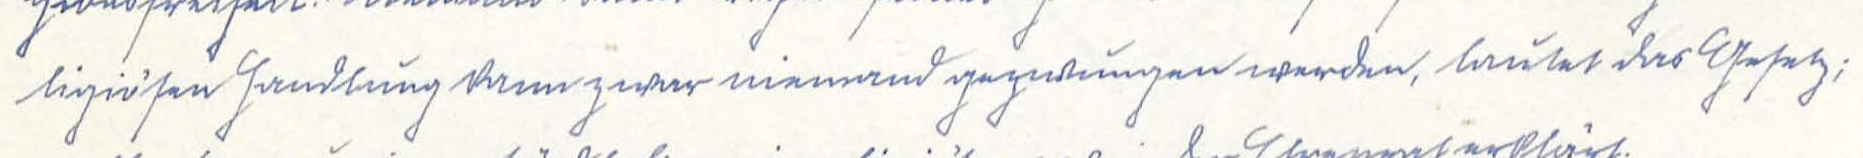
ligiösen Handlung kann zwar niemand gezwungen werden, lautet das Gesetz;
